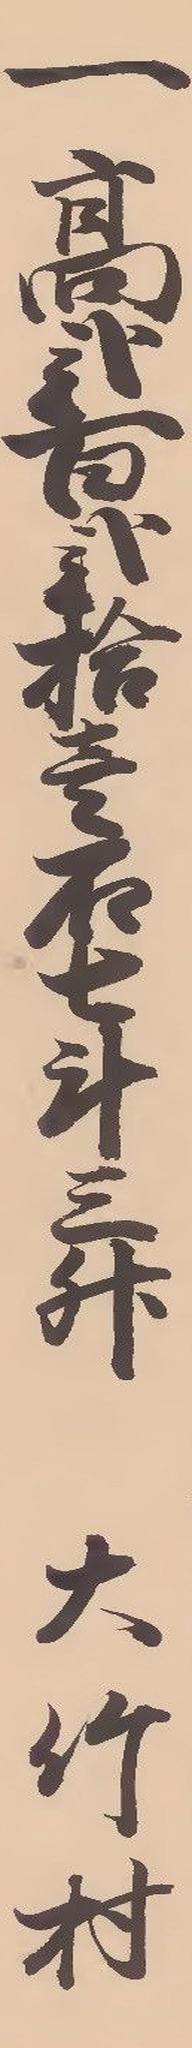一高弐百弐拾壱石七斗三升大竹村

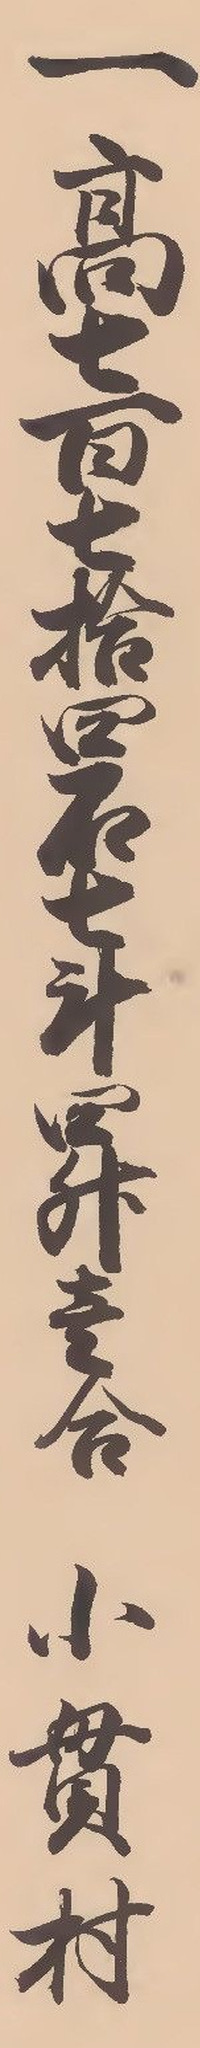一高七百七拾四石七斗四升壱合小貫村
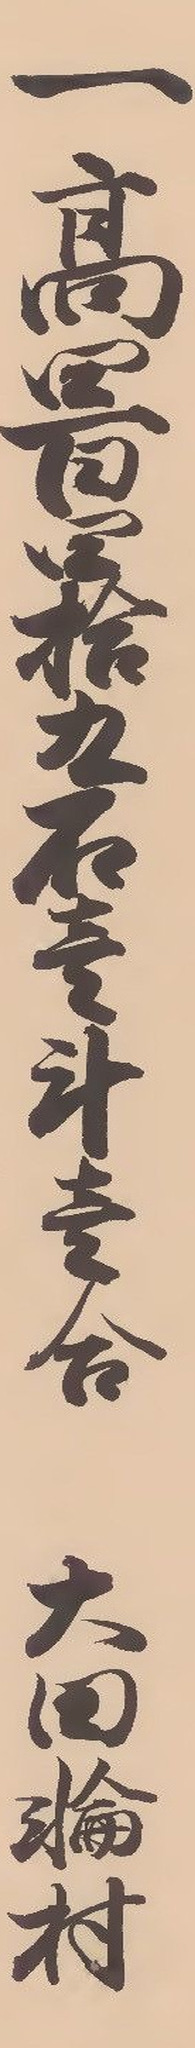一高四百四拾九石壱斗壱合大田輪村
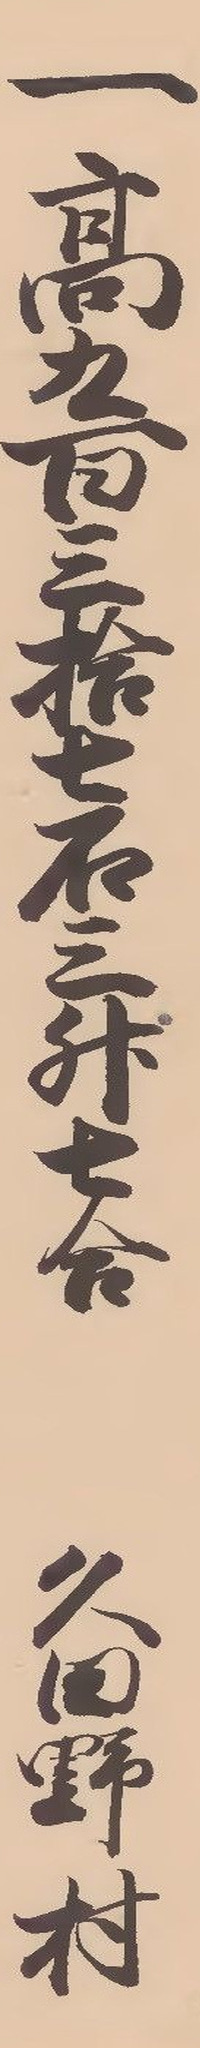一高九百三拾七石三升七合久田野村
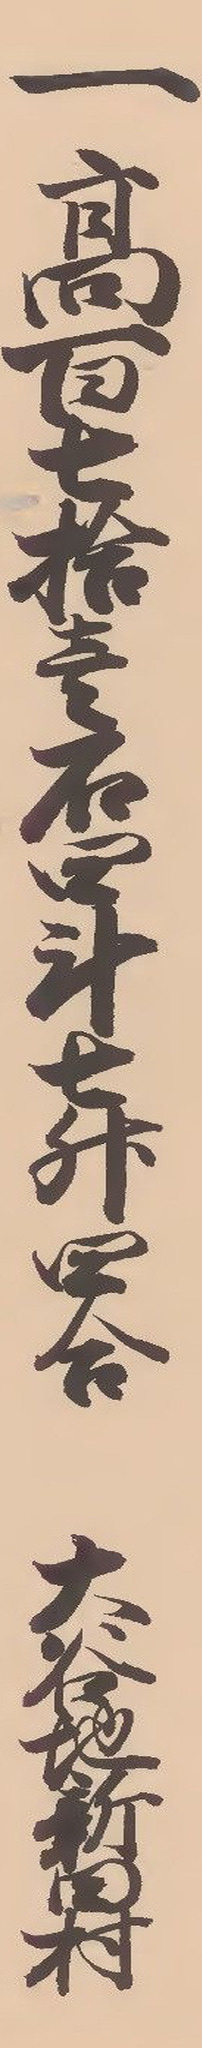一高百七拾壱石四斗七升四合大谷地新田村
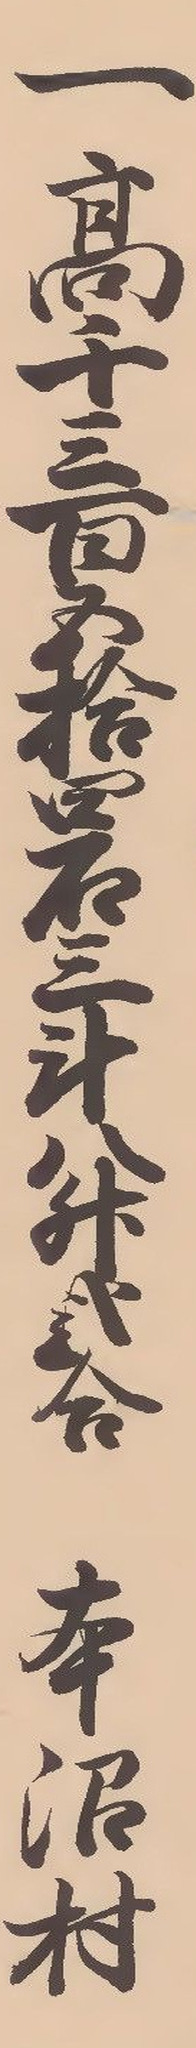一高千三百五拾四石三斗八升弐合本沼村
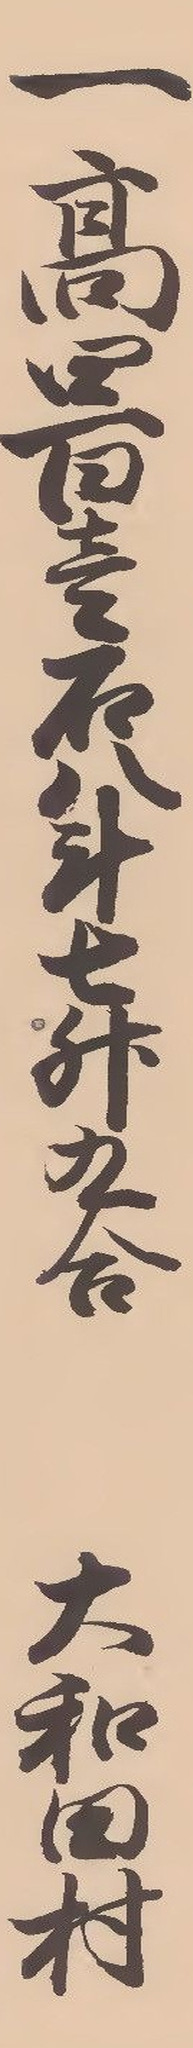一高四百壱石八斗七升九合大和田村
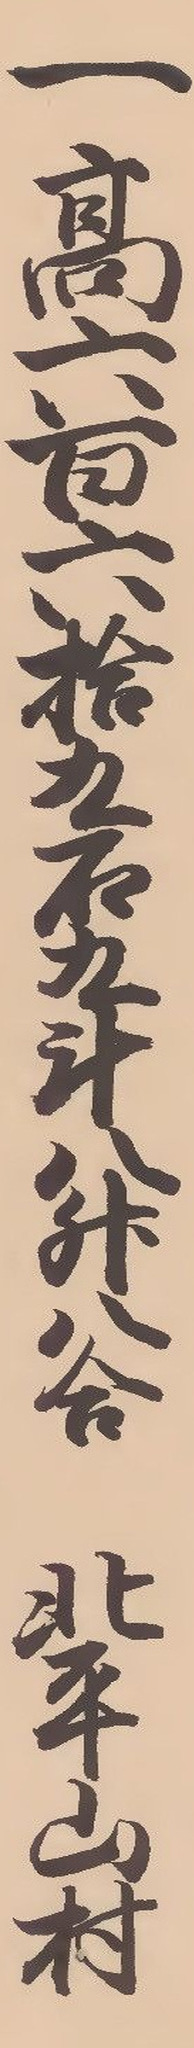一高六百六拾九石九斗八升八合北平山村
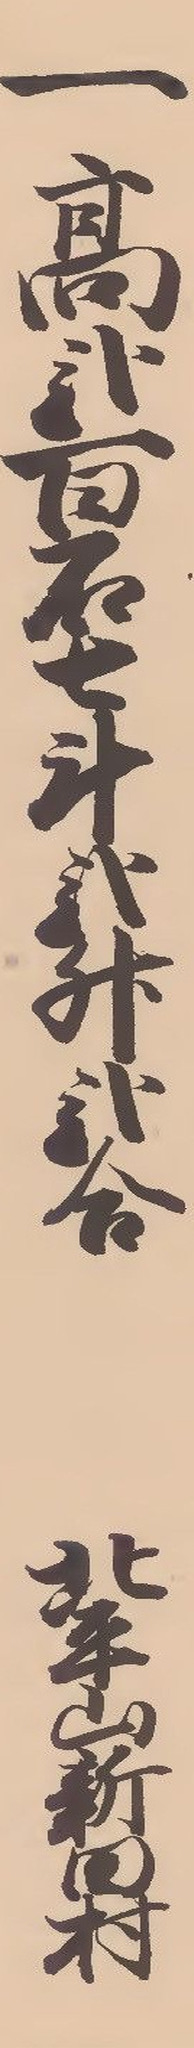一高弐百石七斗弐升弐合北平山新田村

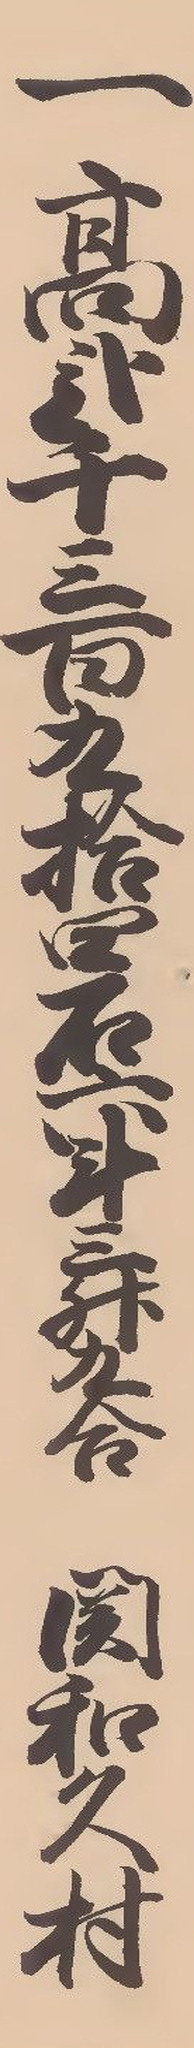一高弐千三百九拾四石六斗三升九合関和久村
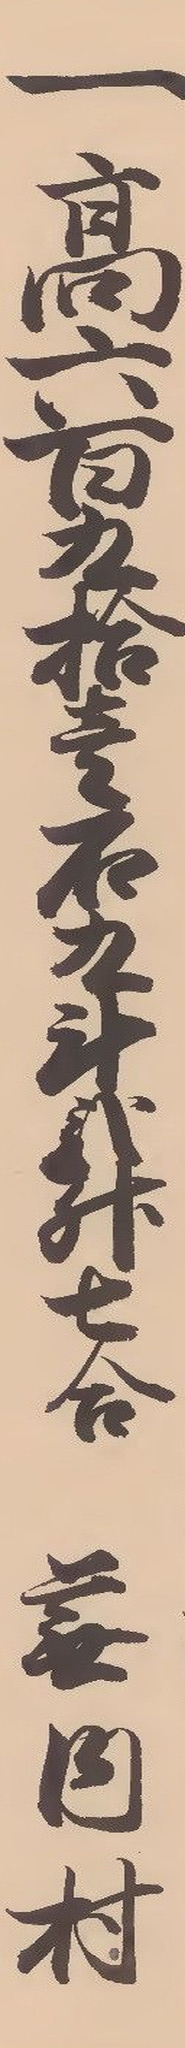一高六百九拾壱石九斗弐升七合蕪内村
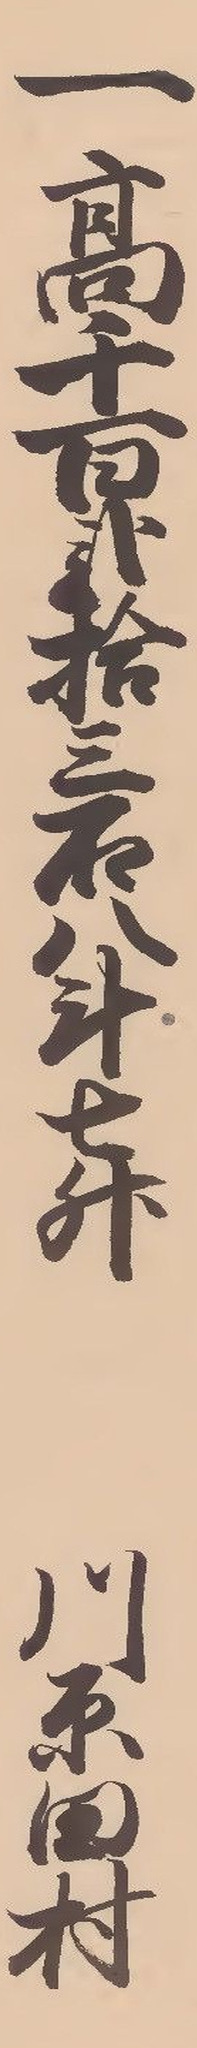一高千百弐拾三石八斗七升川原田村
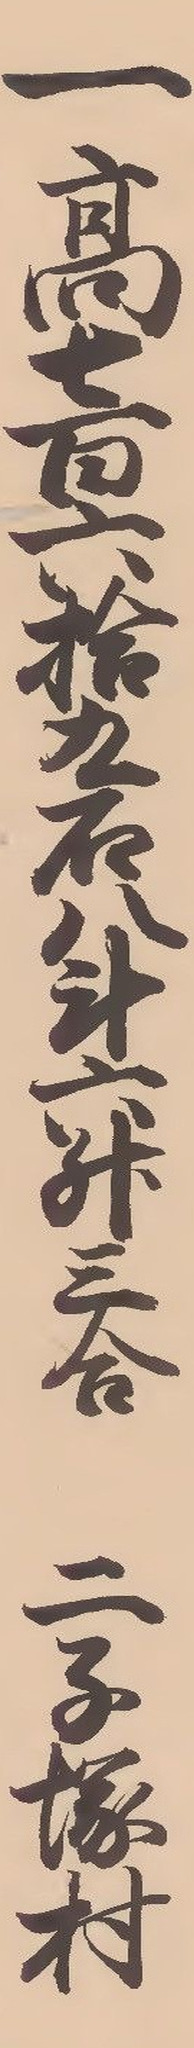一高七百六拾九石八斗六升三合二子塚村
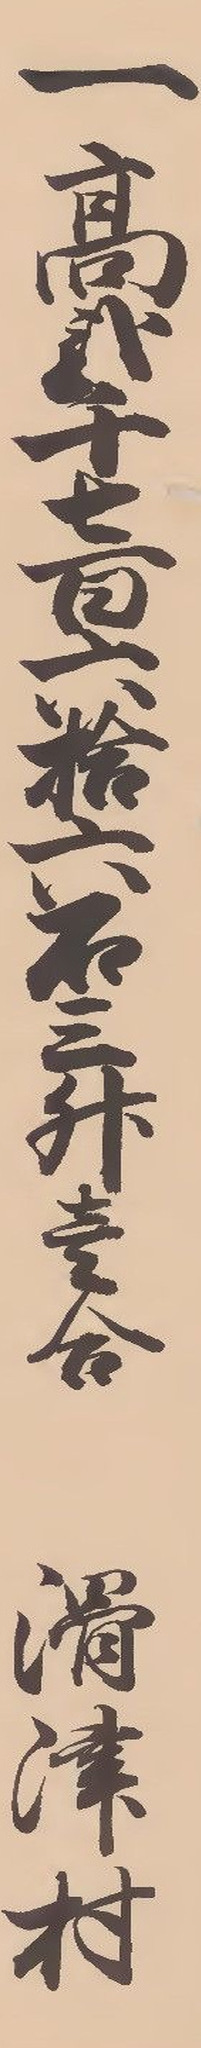一高弐千七百六拾六石三升壱合滑津村
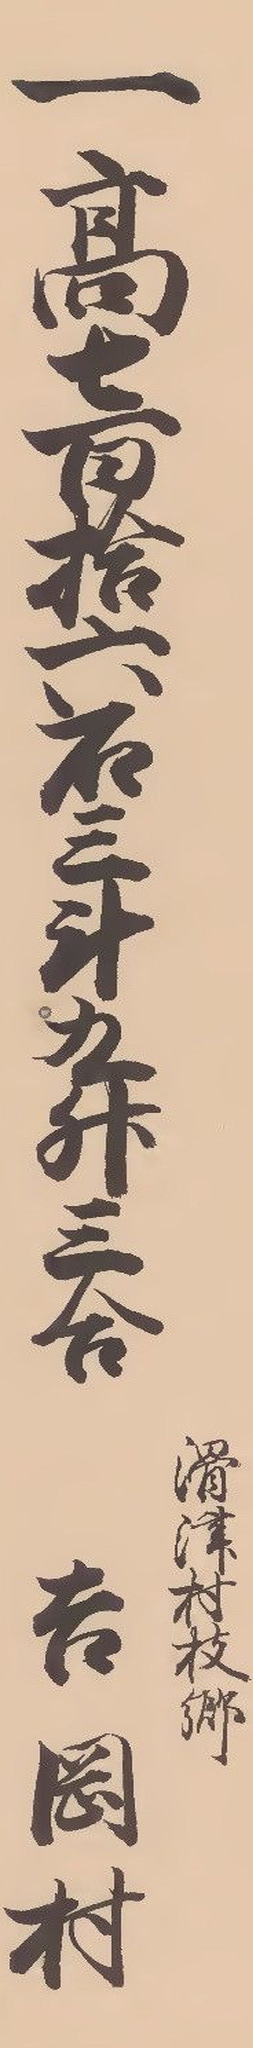一高七百拾六石三斗九升三合吉岡村
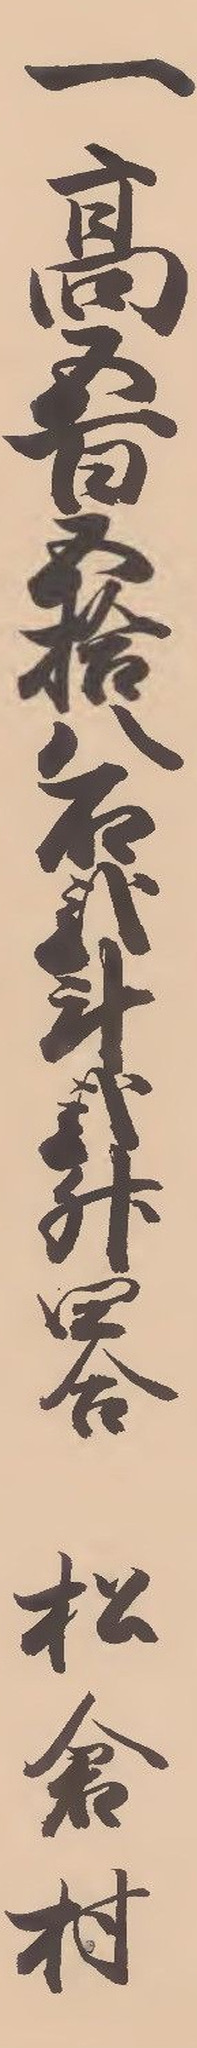一高五百五拾八石弐斗弐升四合松倉村
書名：陸奥国郷帳　２
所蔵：国立公文書館 National Archives of Japan
